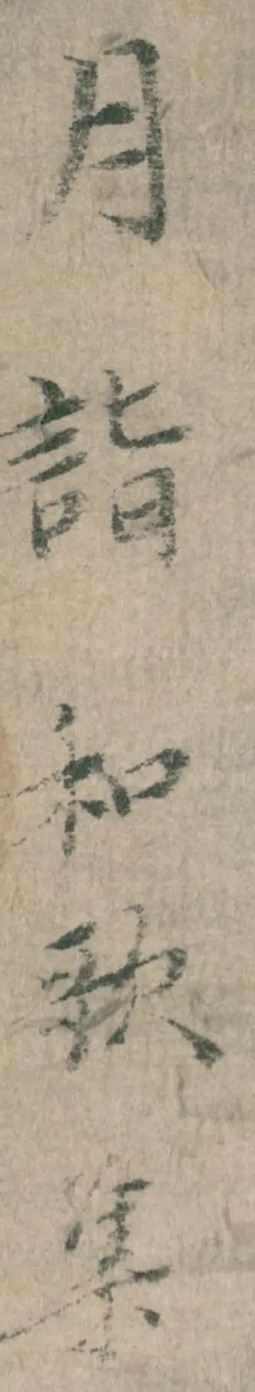月詣和歌集

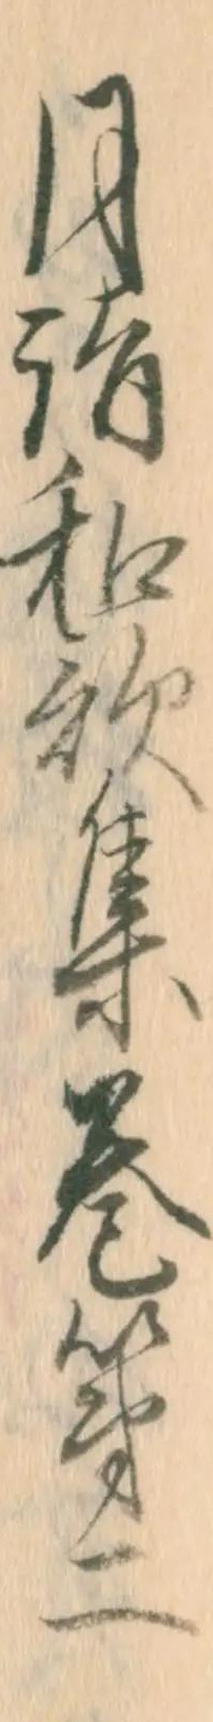月詣和歌集巻第二
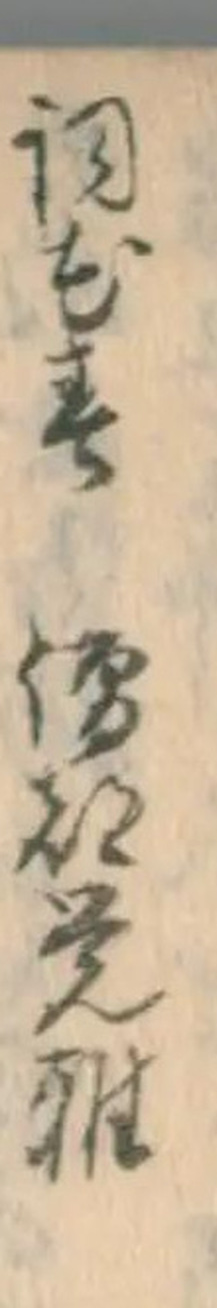詞花春僧都覚雅
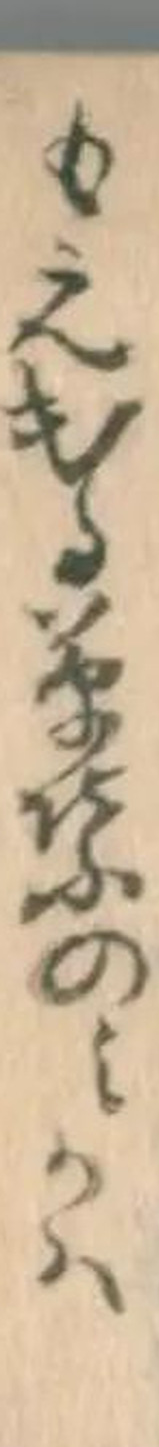もえ出る草葉のみかは
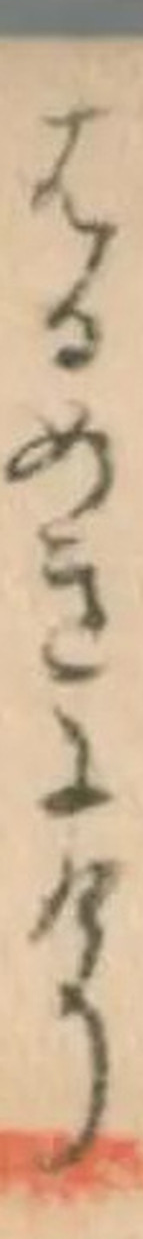はるめきにけり
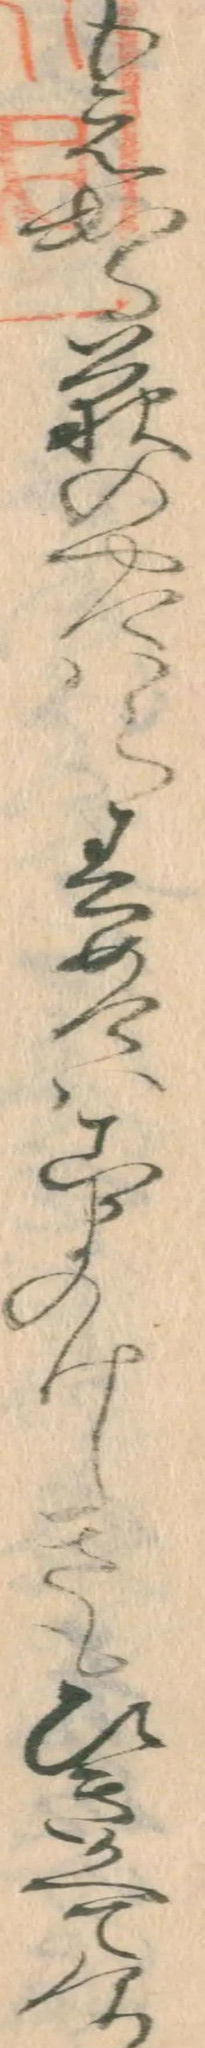もえ出る萩のやけはら春めけはこまのけしきもひきかへてけり
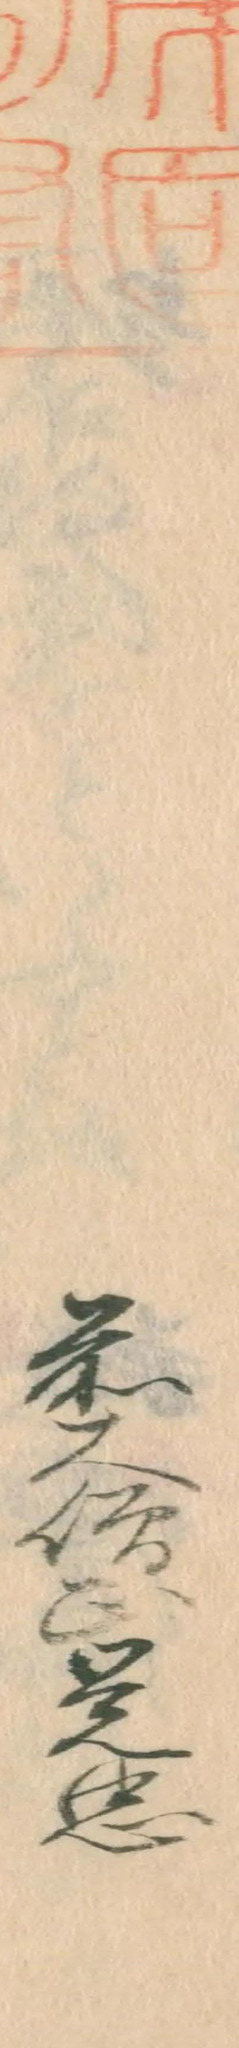前大僧正覚忠
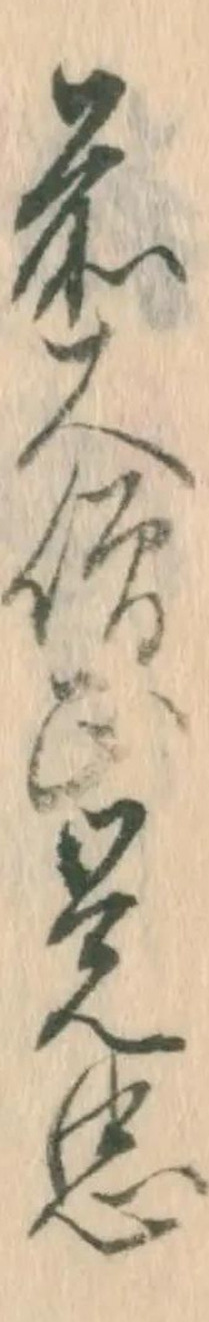前大僧正覚忠
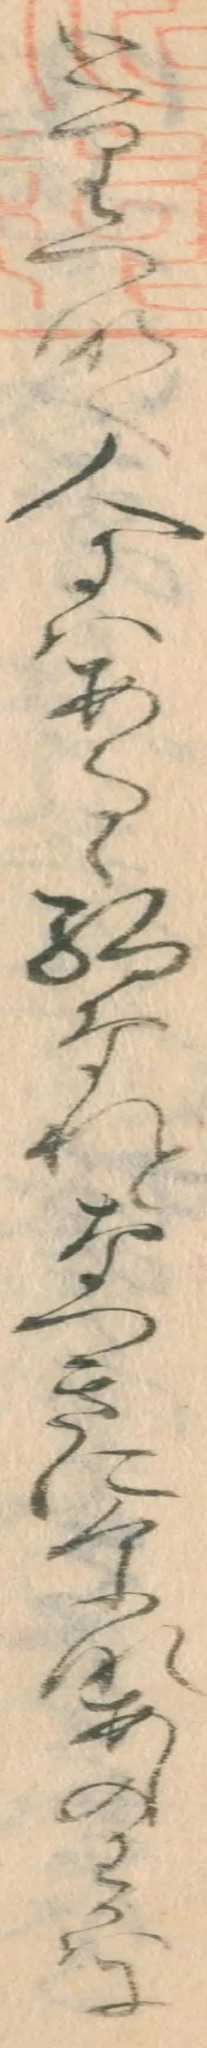とりつなく人にはあるゝ駒なれとなつきにけりなあしのわかはに
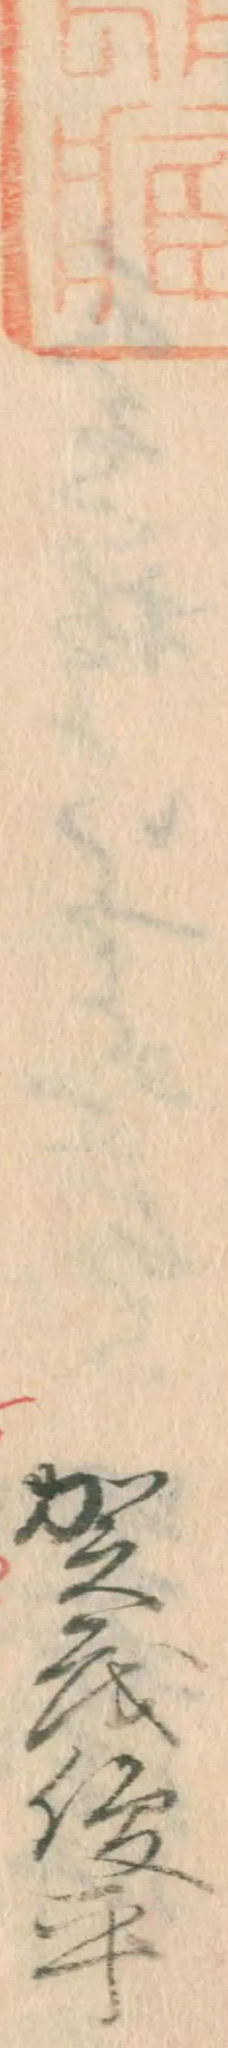賀茂俊平
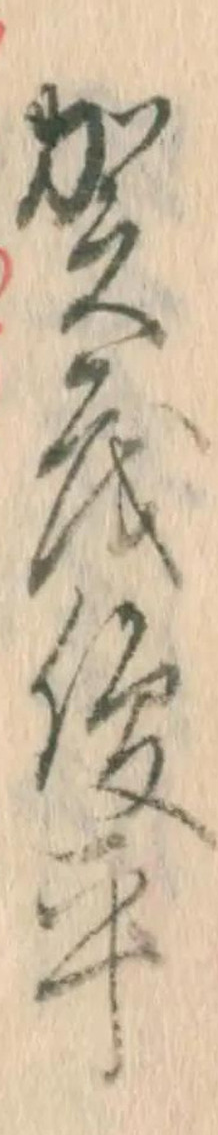賀茂俊平
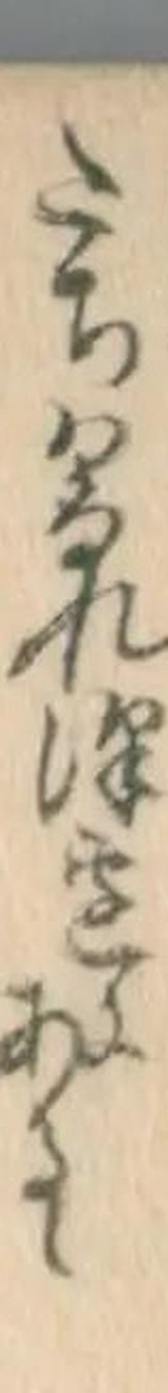たちはなれ沢辺にあるゝ
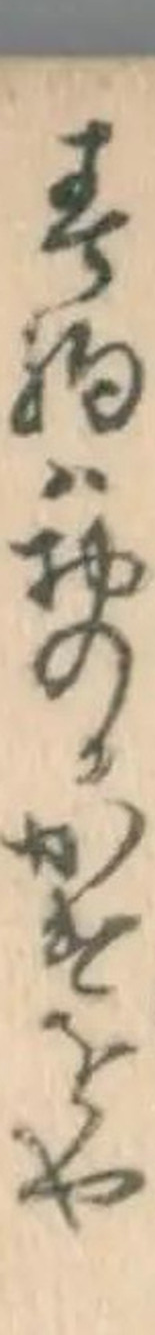春駒はおのかかけをや
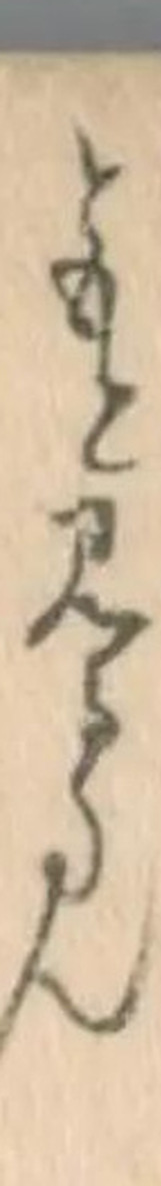ともと見るらん
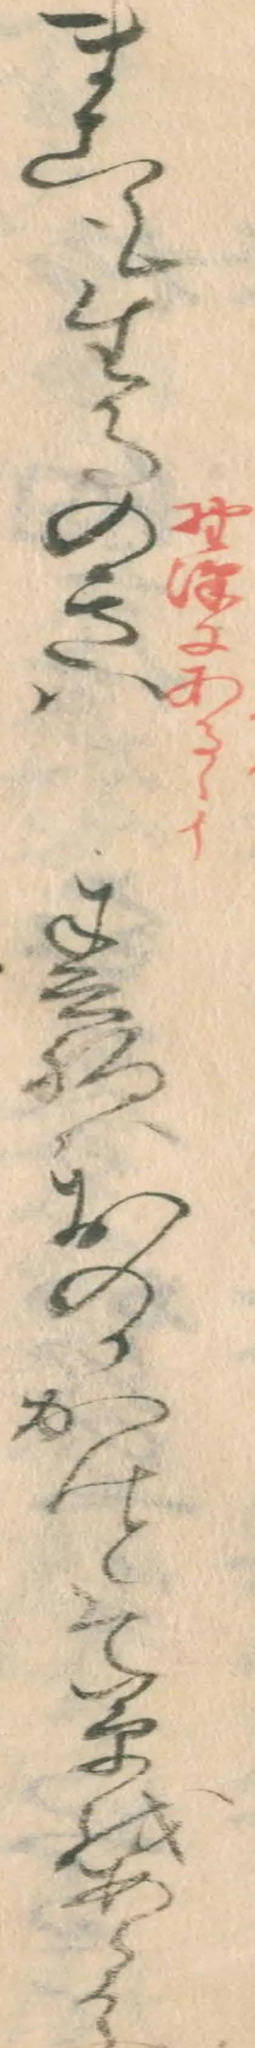まこも生るのきは春駒はおのかかけとそ草をあらかふ
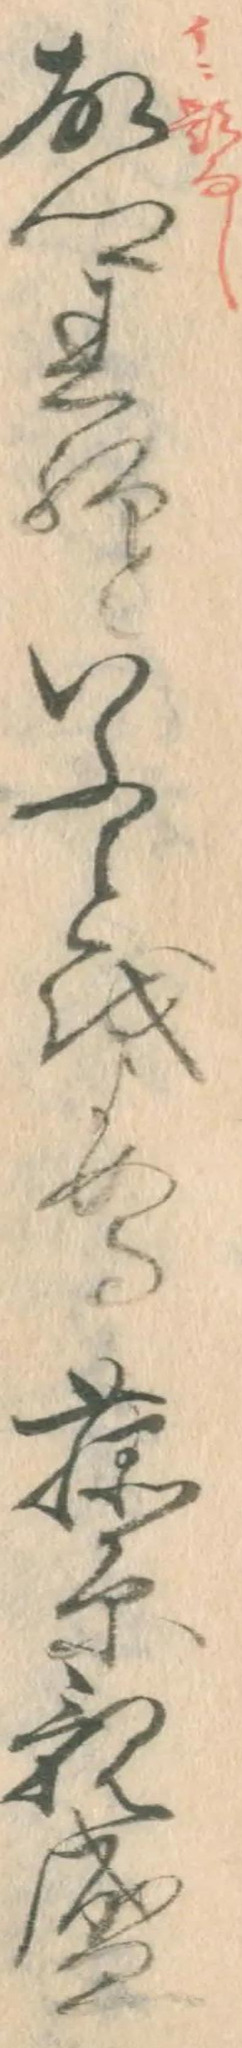故郷春駒といふとをよめる藤原親盛
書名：月詣和歌集
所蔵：国立国会図書館 National Diet Library, JAPAN
